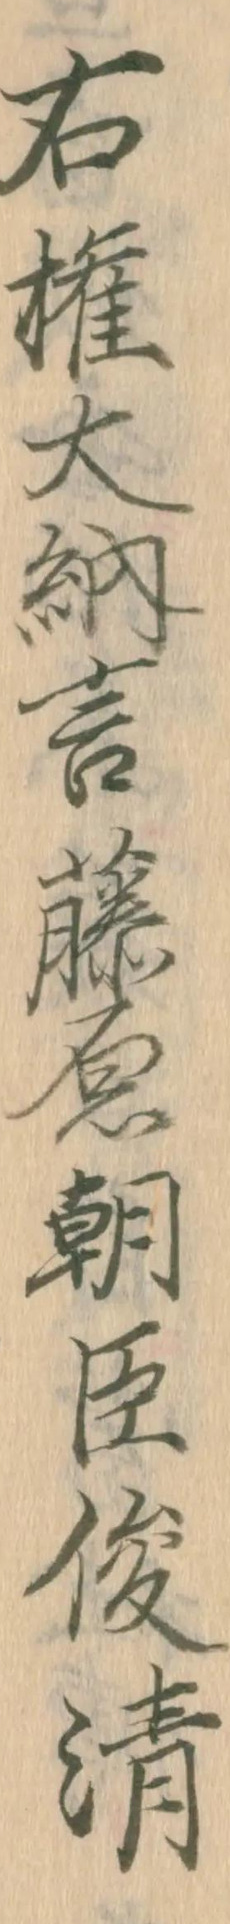右権大納言藤原朝臣俊清
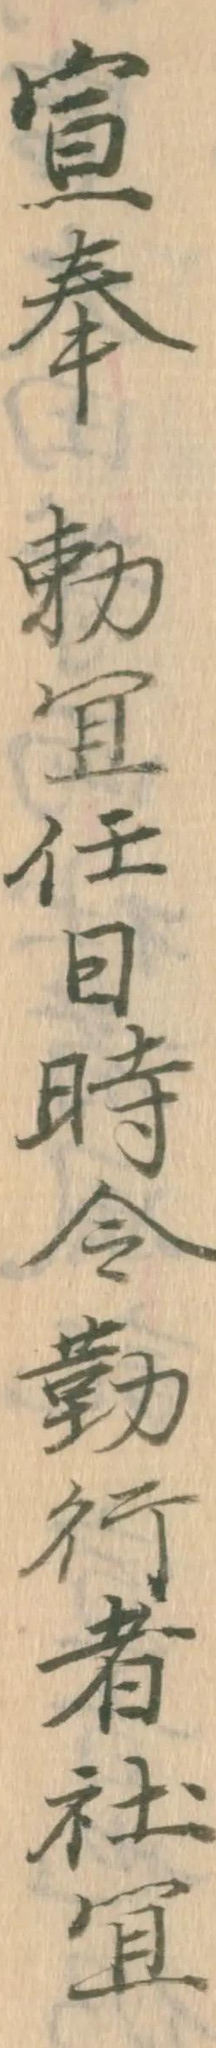宣奉勅宜任日時令勤行者社宜
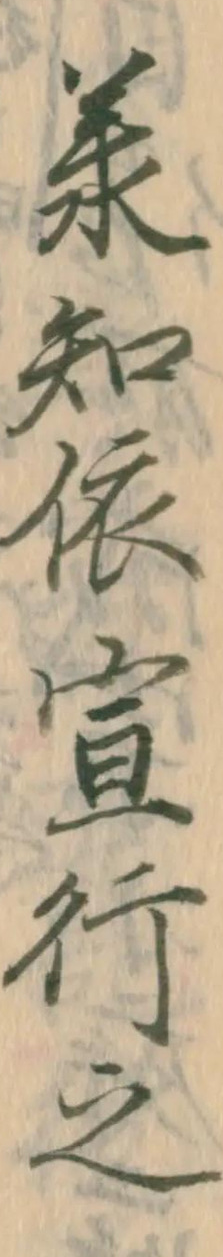承知依宣行之
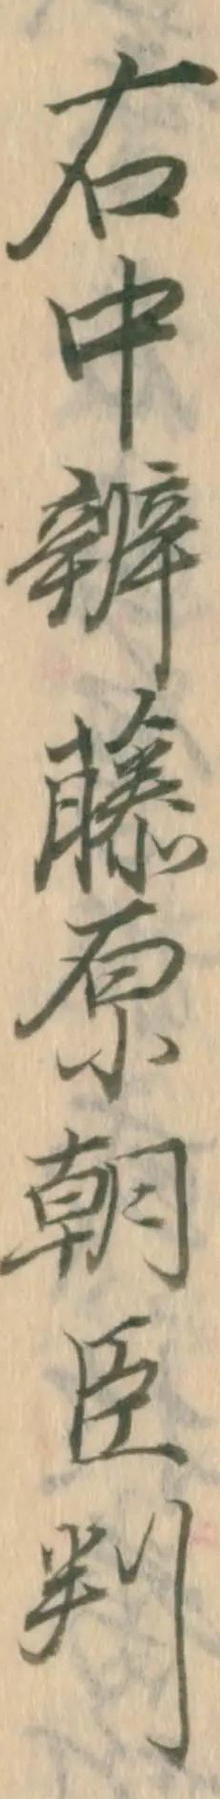右中弁藤原朝臣判

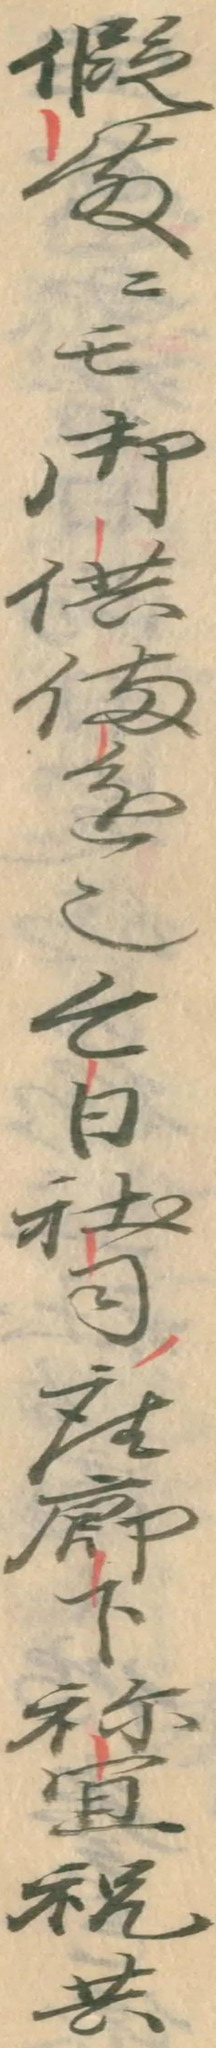仮_殿ニモ御-供備-進也今-日社-司座廊-下祢-宜祝共
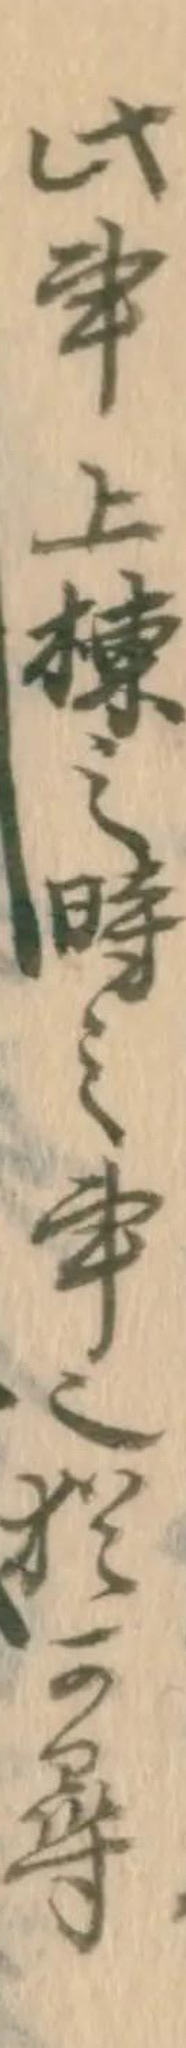此事上棟之時之事也猶可尋
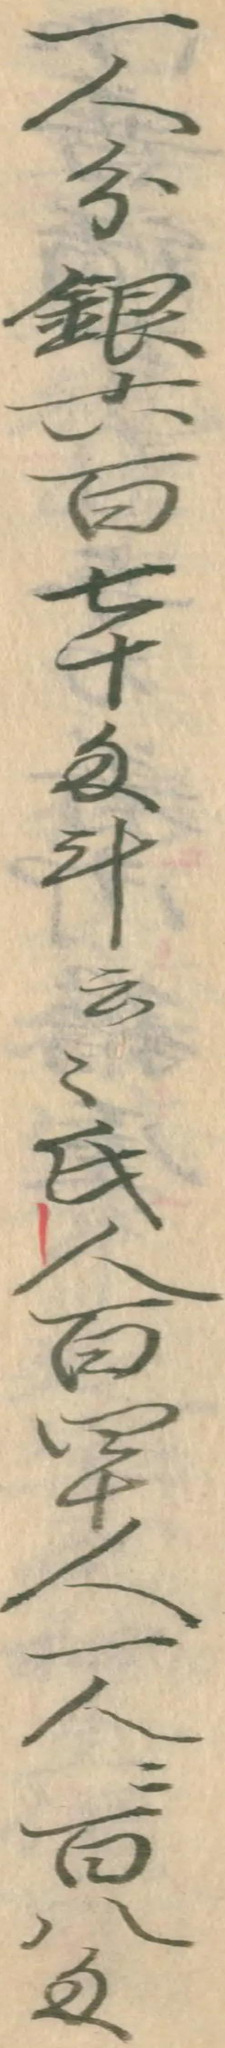一人分銀六百七十匁計云々氏百四十人一人ニ百八匁
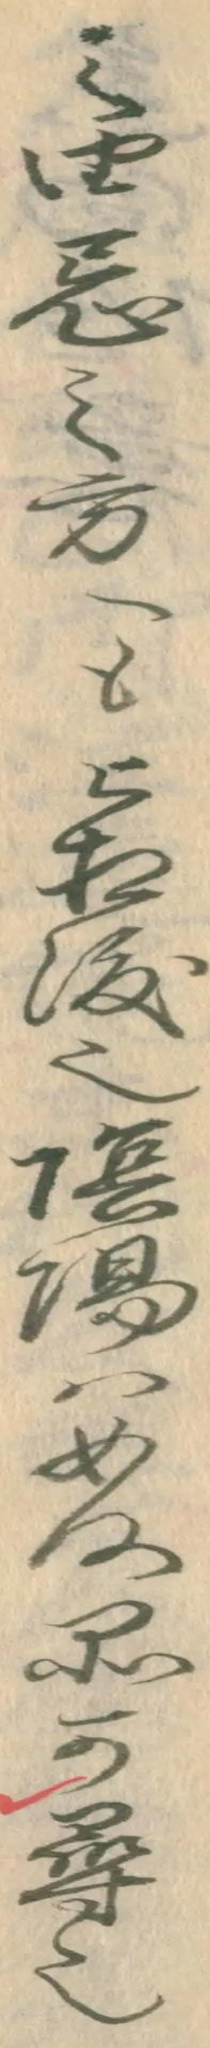之由忌之方へも被相渡也陰陽ハ如何品可尋也

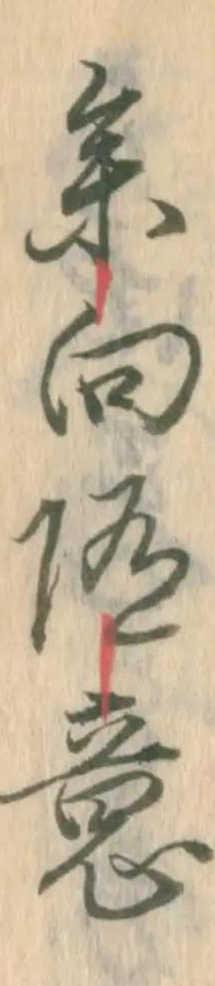参-向随-意

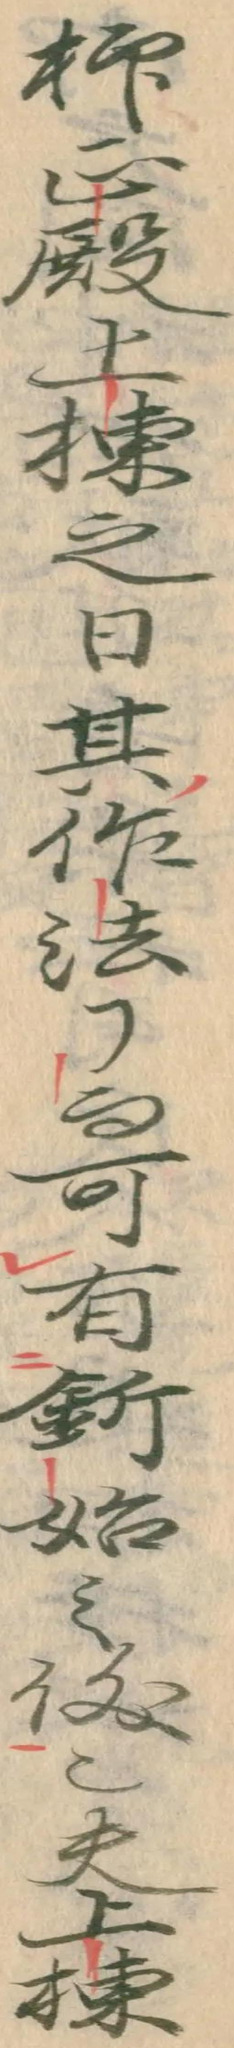抑正-殿上-棟之日其作-法了_而可有釿_始之儀也夫上-棟

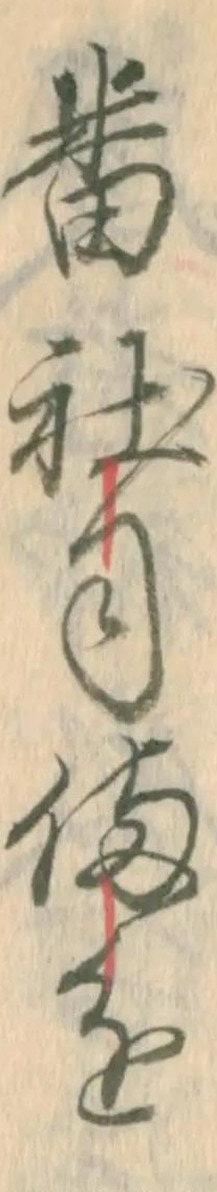番社-司備-進
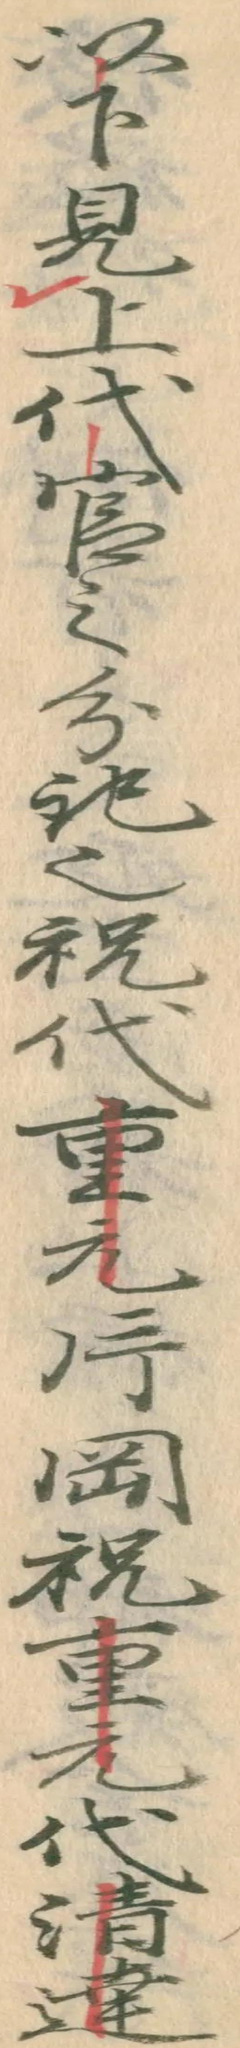以-下見上代-官之分記也祝代重元片岡祝重元代清達
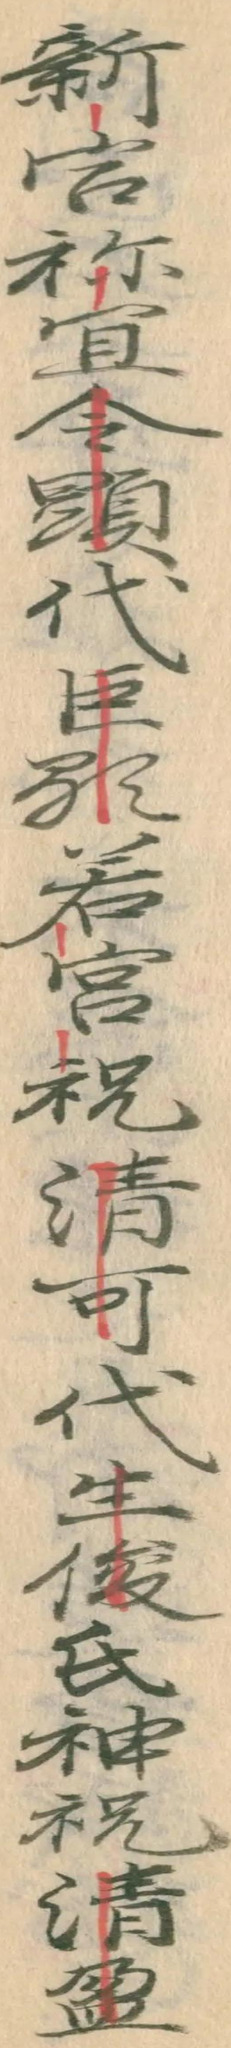新-宮祢-宜令顕代巨顕若_宮_祝清可代生俊氏神祝清盈
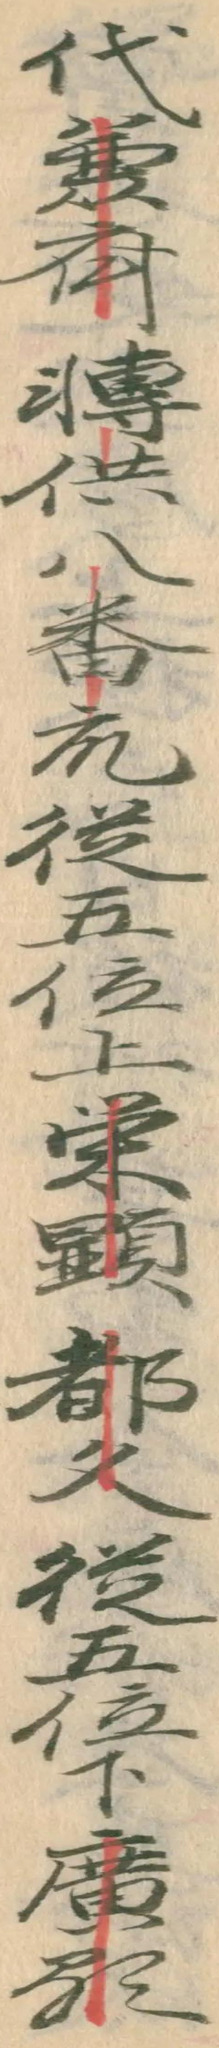代兼斉転-供八-番-衆従五位上栄顕都久従五位下廣顕
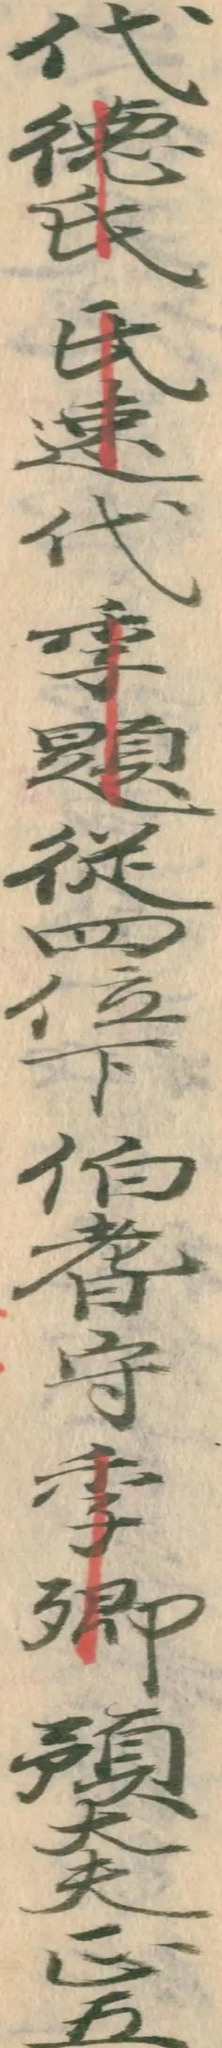代徳氏氏速代季題従四位下伯耆守季郷預大夫正五
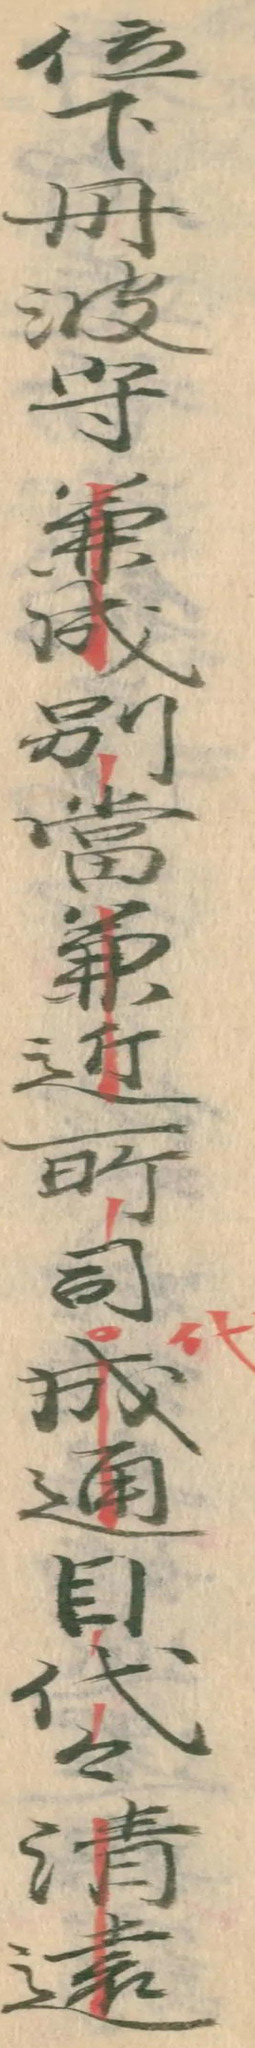位下丹波守兼成別-当兼近所-司￮成通目-代-々清遠
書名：賀茂社記録. 第16冊
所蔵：国立国会図書館 National Diet Library, JAPAN
